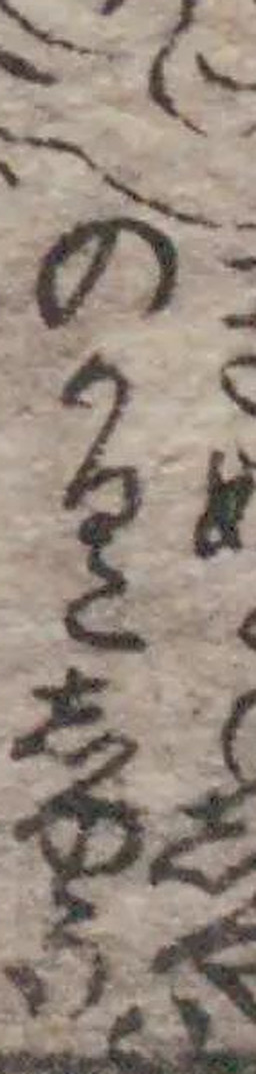のかるこしやうは
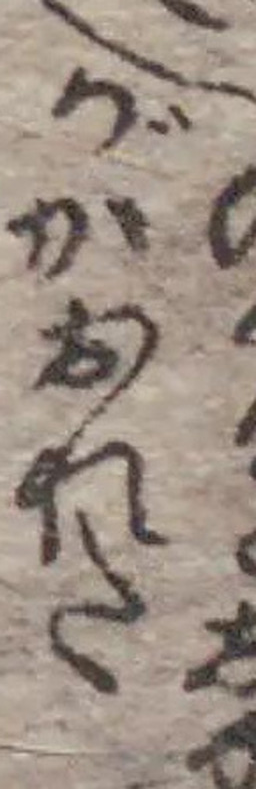がかおれた
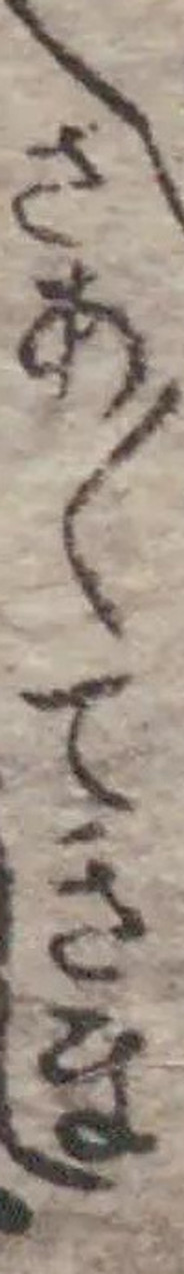さあ〳〵てきました
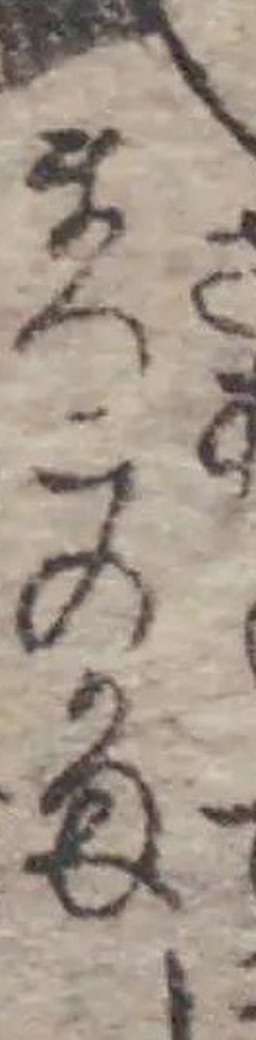まつこのかま
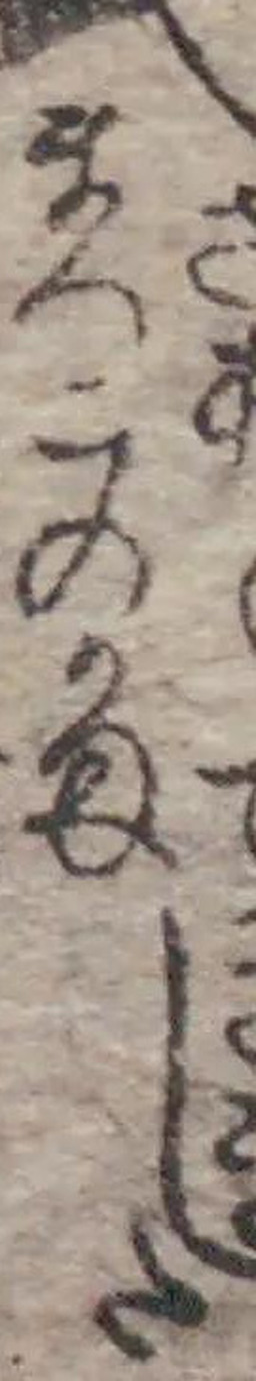まつこのかま
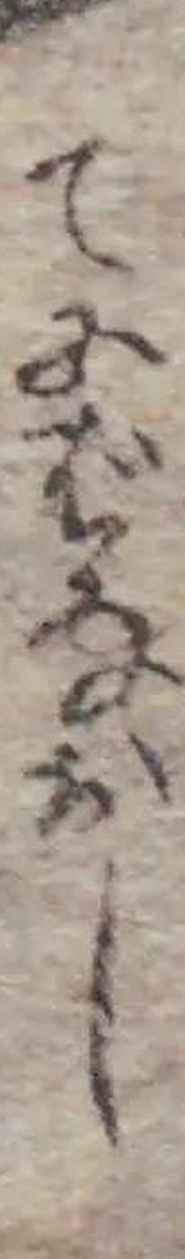てにばなおし
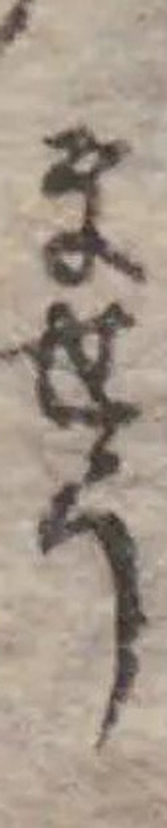ませう
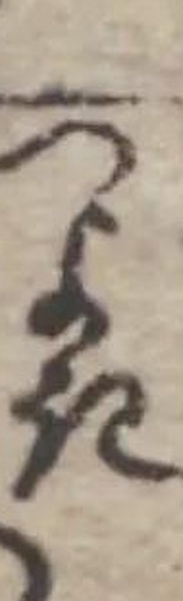つよき
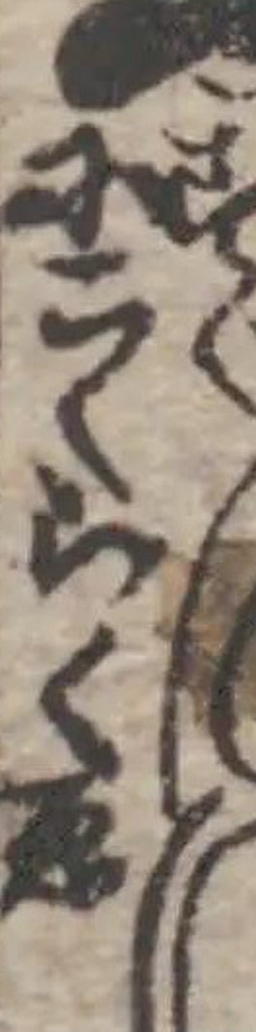にこくらくゑ
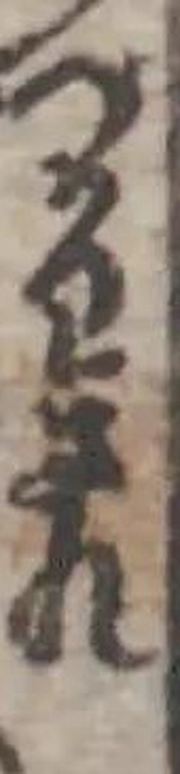つかわされ
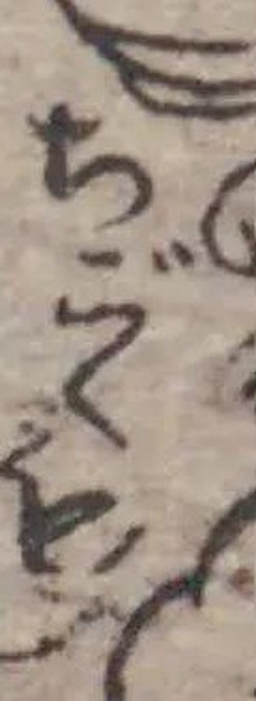ちごくも
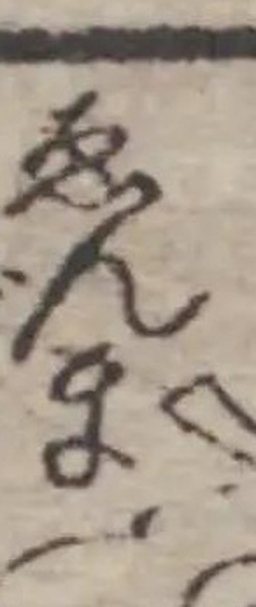ゑんま
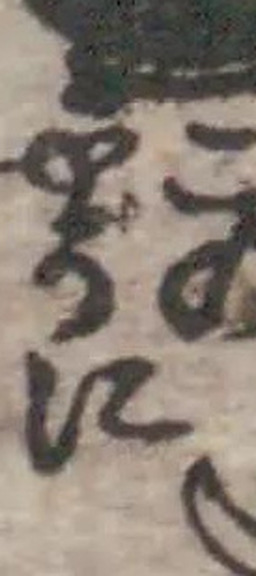やうに
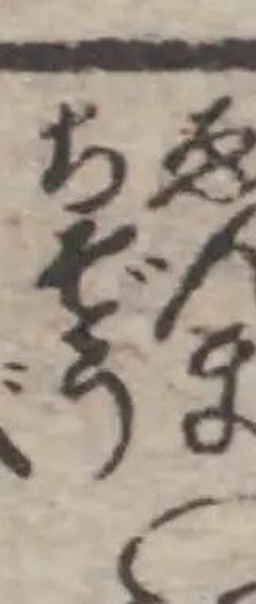ちぞう
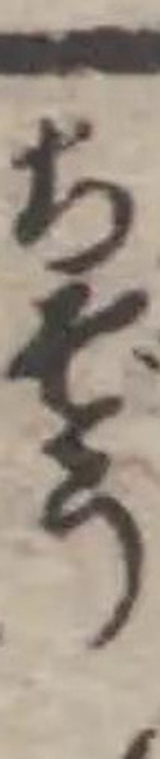ちぞう
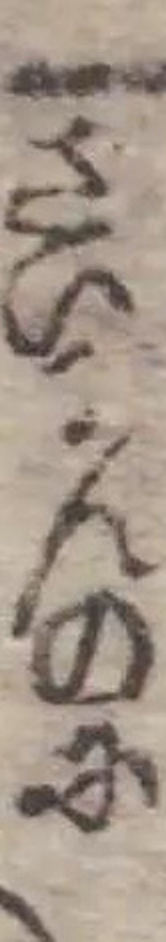さいにんのに
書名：大磯地蔵咄 2巻
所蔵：国立国会図書館 National Diet Library, JAPAN
